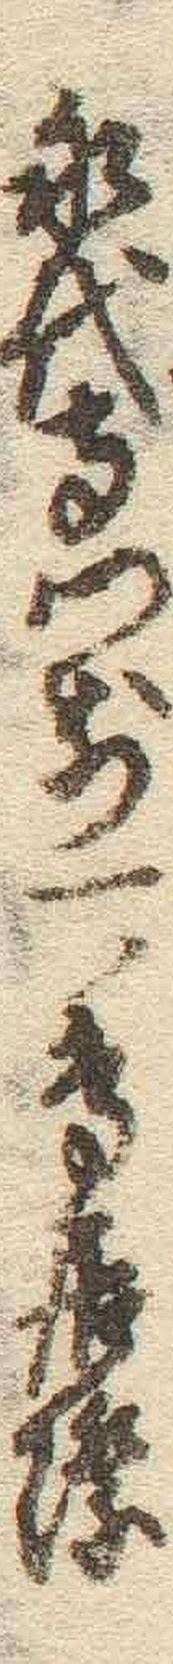永代寺門前一ノ鳥居際
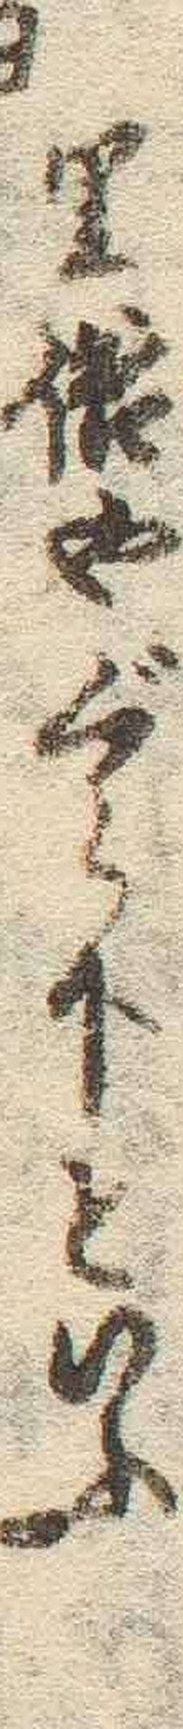里俗やぐら下といふ
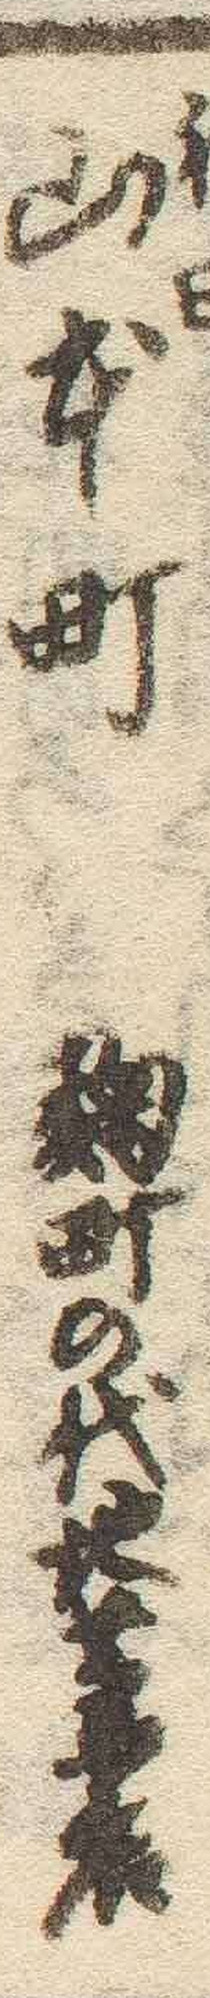山本町麹町の代地藁店
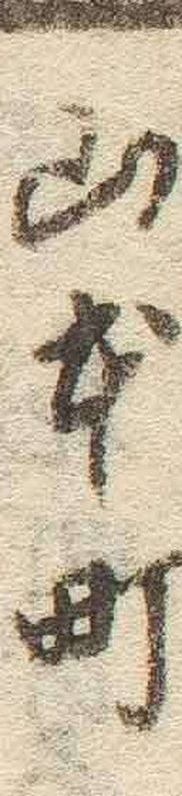山本町
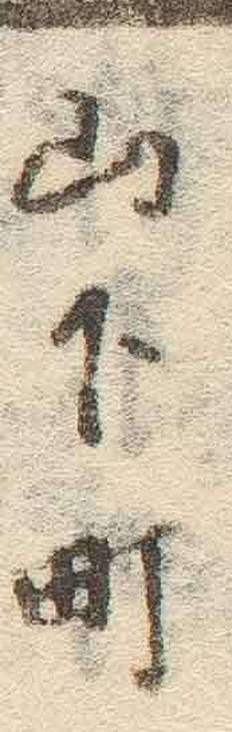山本町
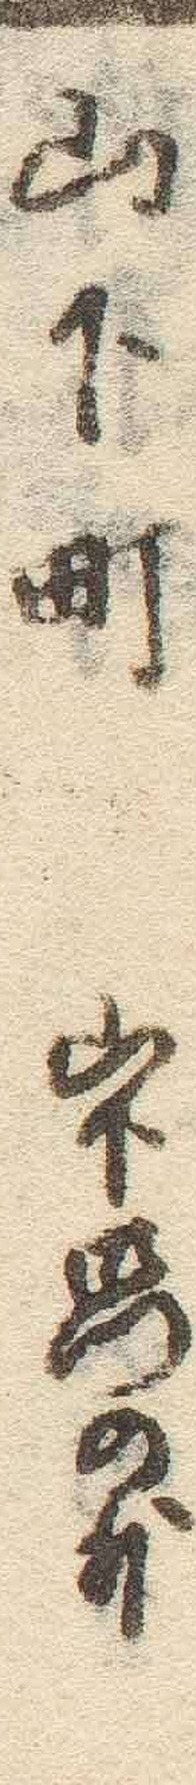山下町山下御門の外
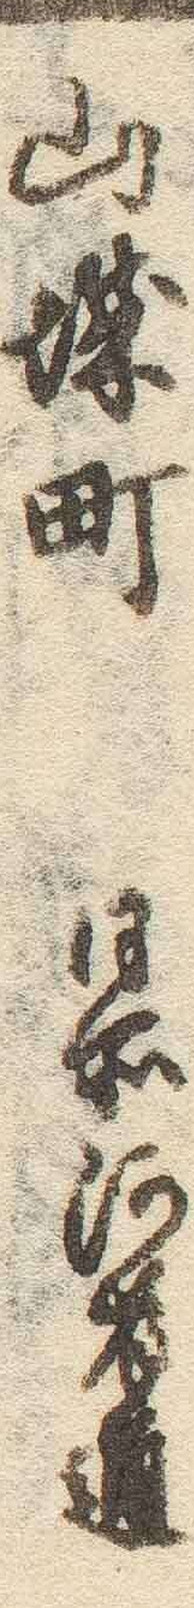山城町同所河岸通
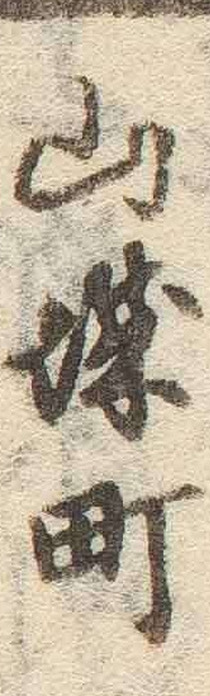山本町
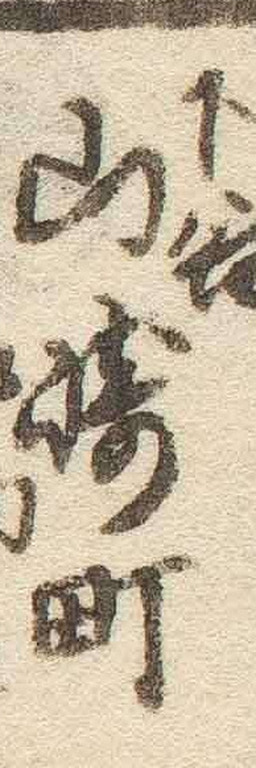山本町
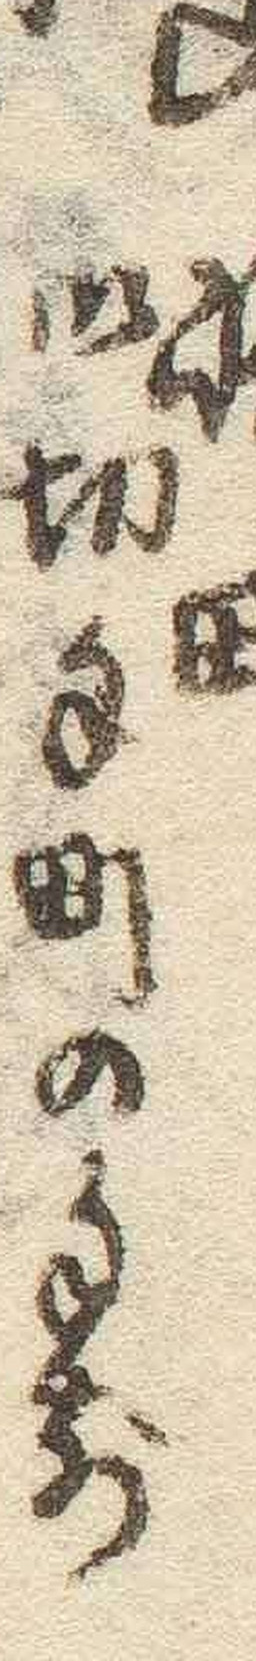御切手町の手前
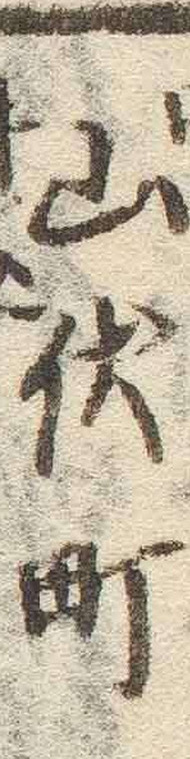山本町
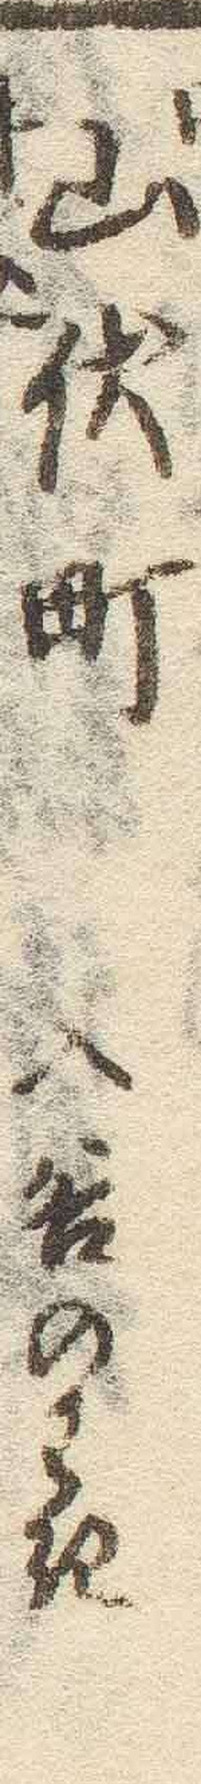山伏町入谷のさき
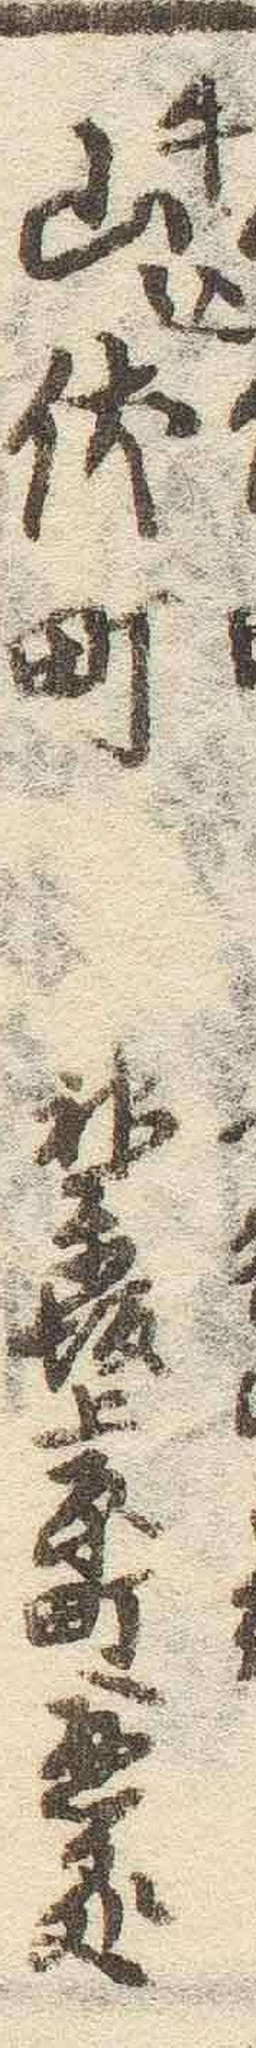山伏町神楽坂上原町へ通る処
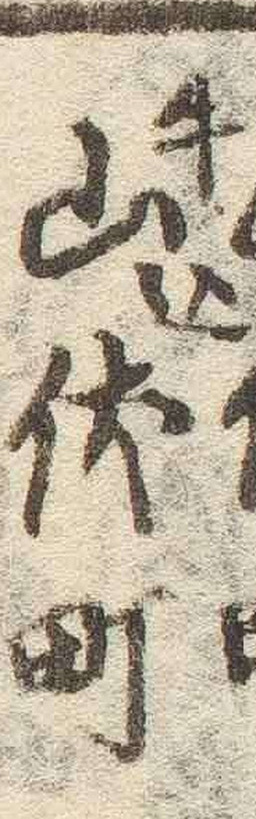山本町
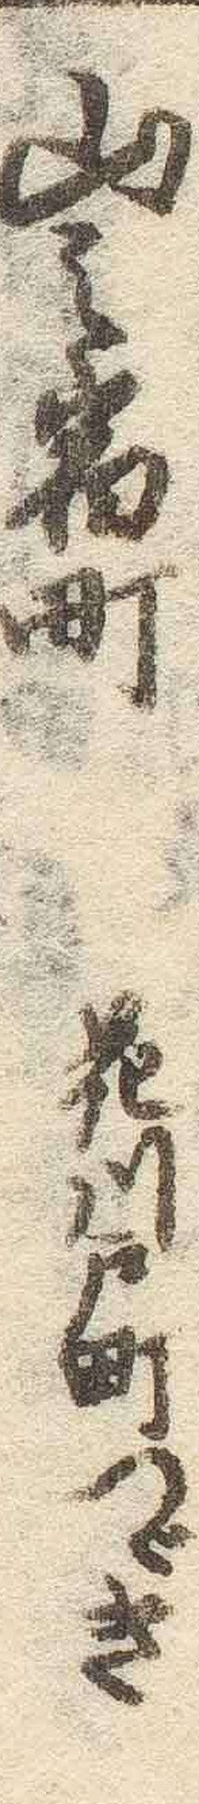山之宿町花川戸町つゞき
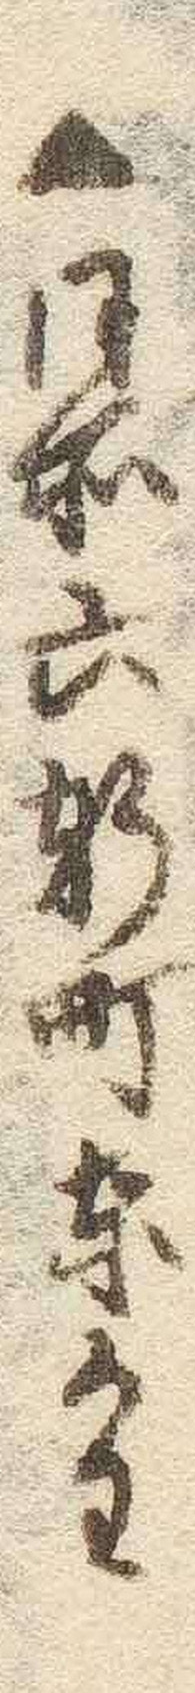▲同所六軒町東かわ
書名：江戸町独案内
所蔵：東京学芸大学附属図書館 国文学研究資料館
